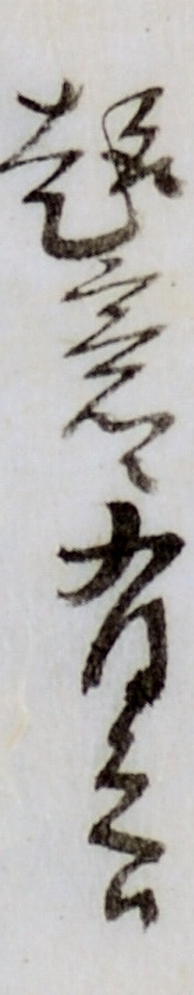趣意に有之候
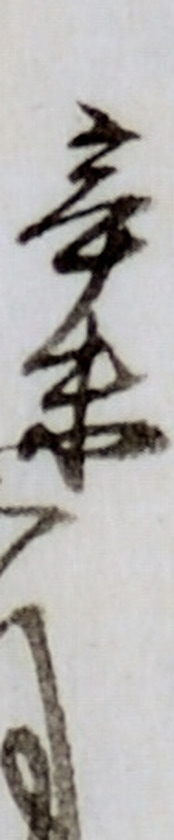辛未五月
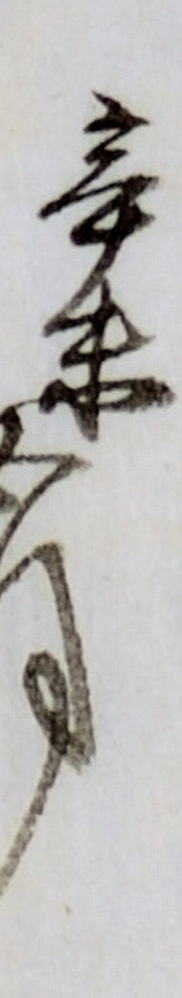辛未五月
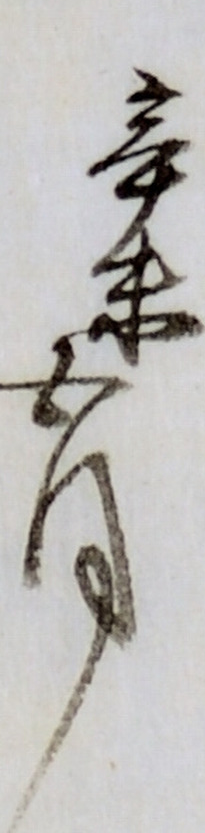辛未五月

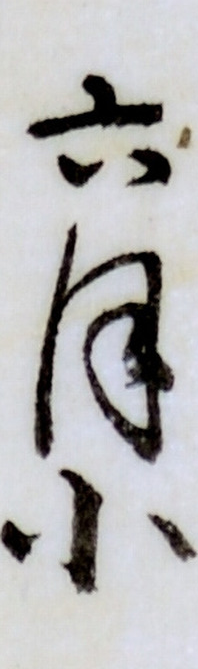六月小
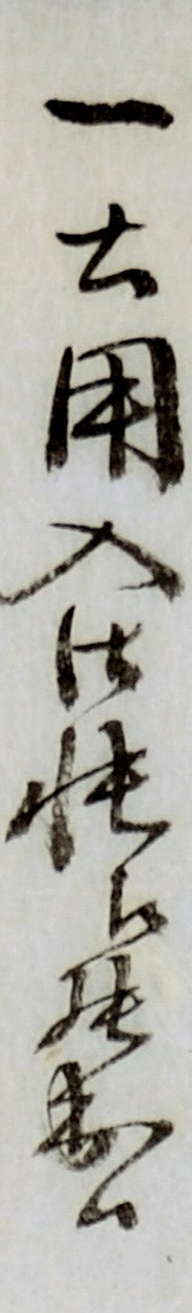一土用入御帳え罷出候
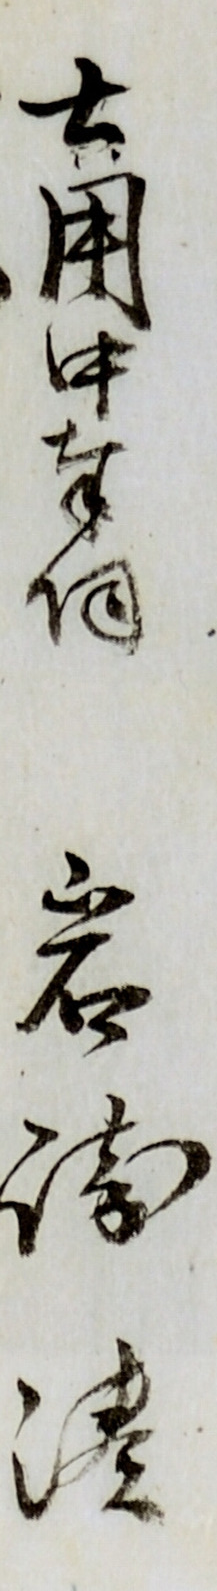土用中奉伺岩崎湊
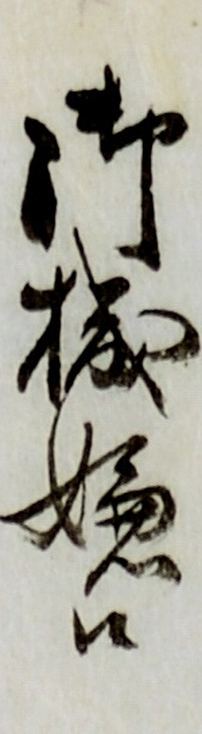御機嫌候
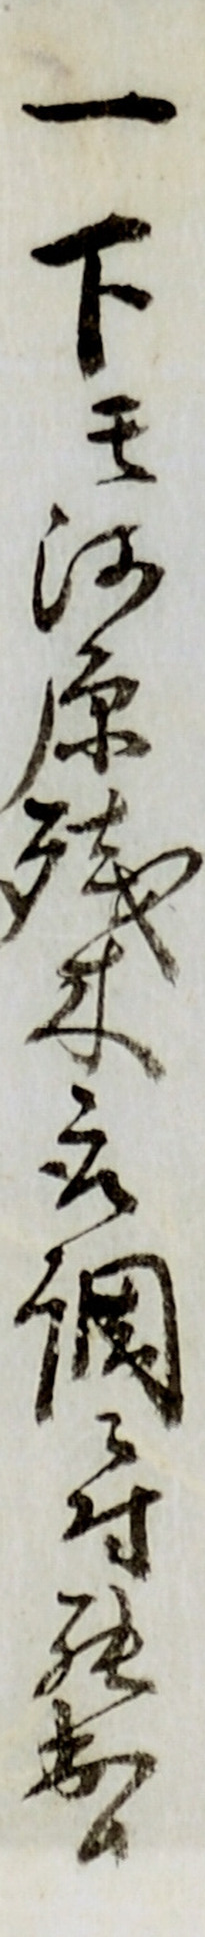一下モ河原残木取調に付罷出候
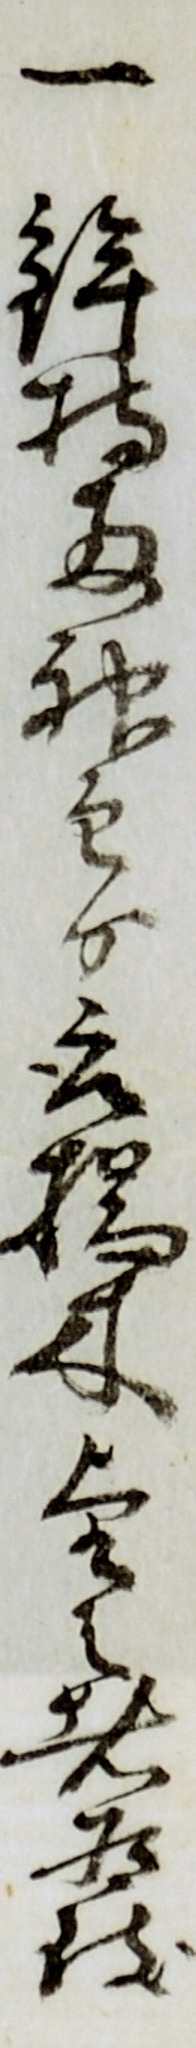一鉾持両神主ゟ取揚木望之者為致
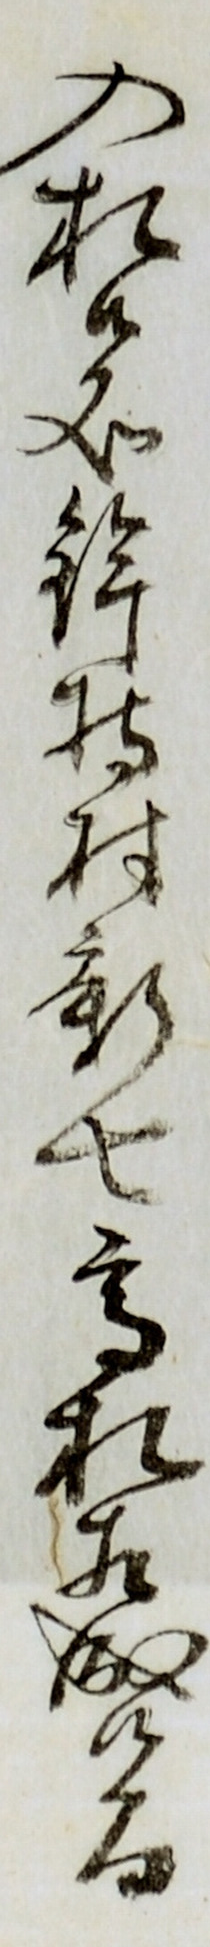入札候処鉾持村新七高札相成候間
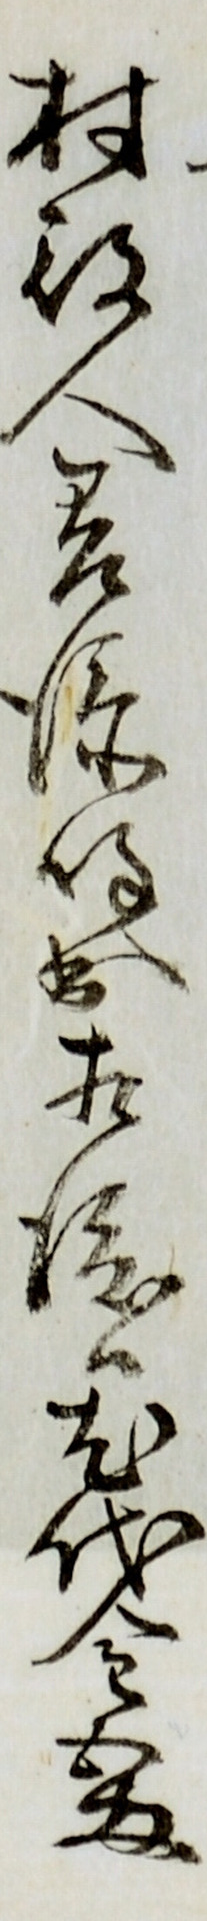村役人差添呼出相渡候尤代金五両
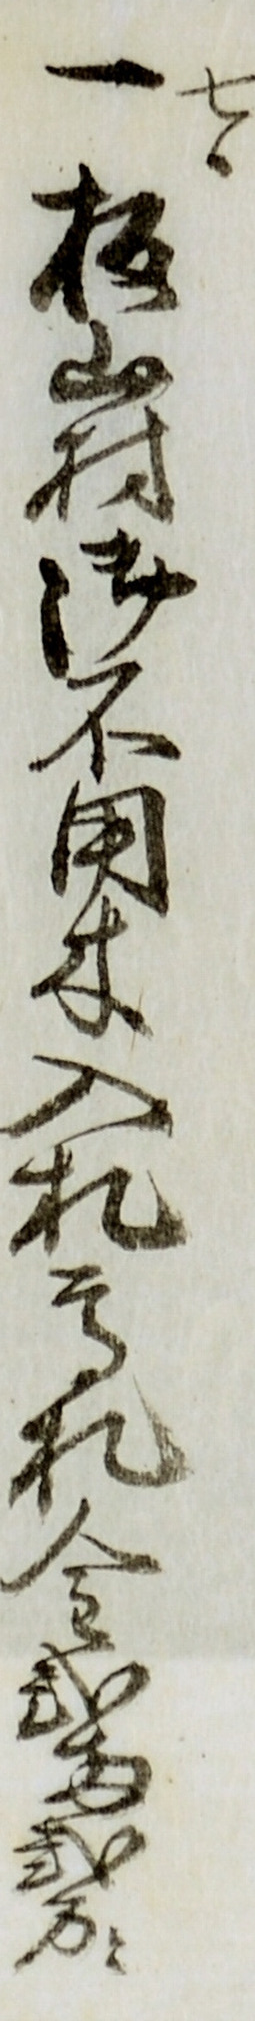一板山村御不用木入札高札金弐両弐分に
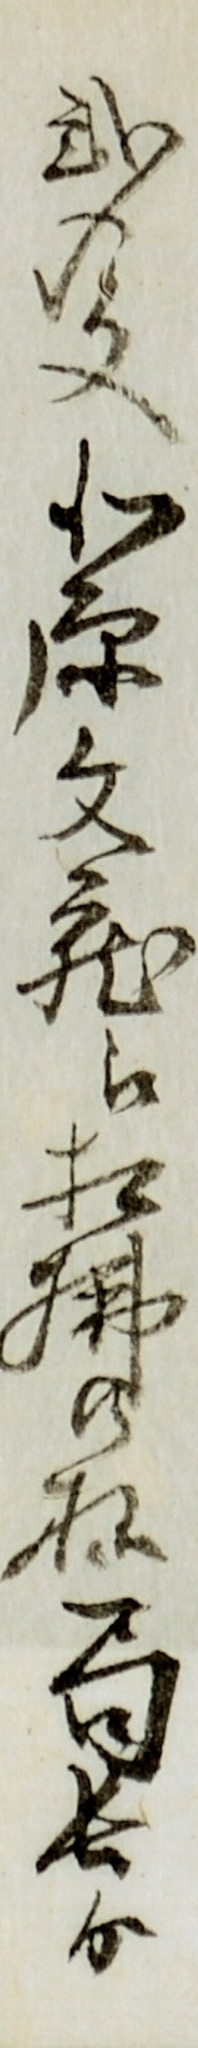弐貫文北原文蔵え相払候様局長ゟ
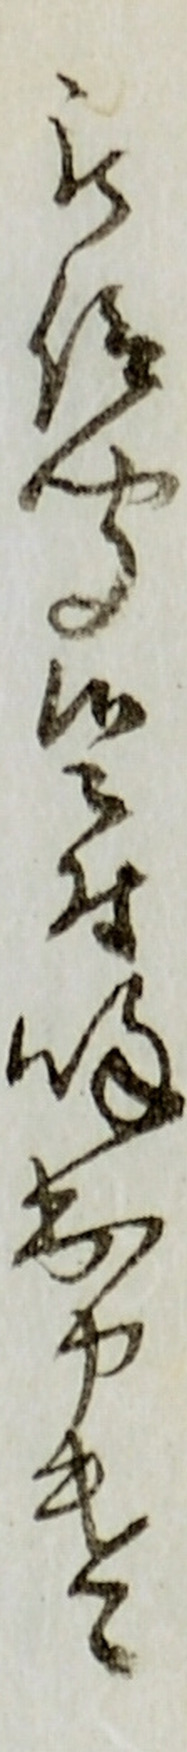被仰聞候に付呼出申遣候
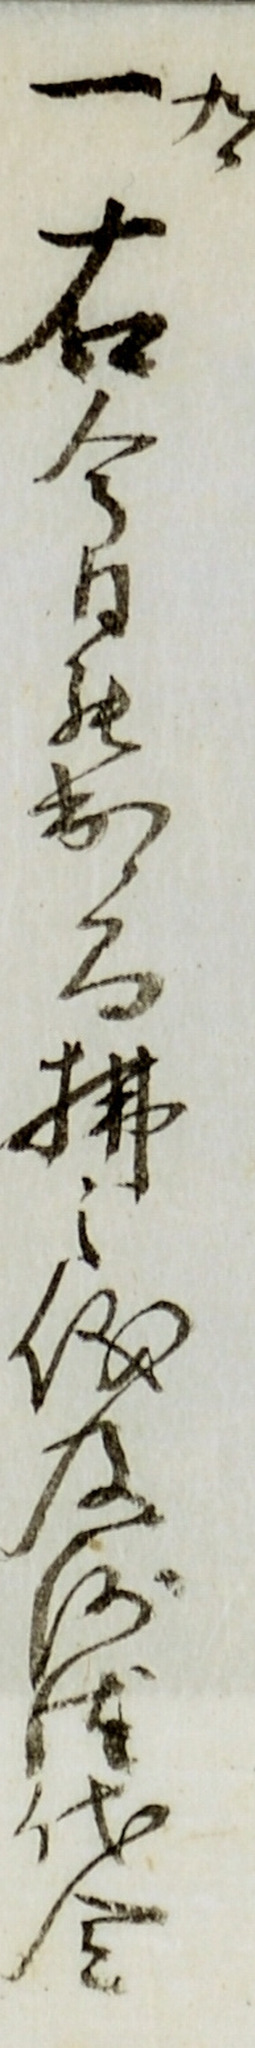一右今日罷出候間払之儀及沙汰代金
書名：山林方諸事御用留
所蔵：伊那市立高遠町図書館・合同会社AMANE
